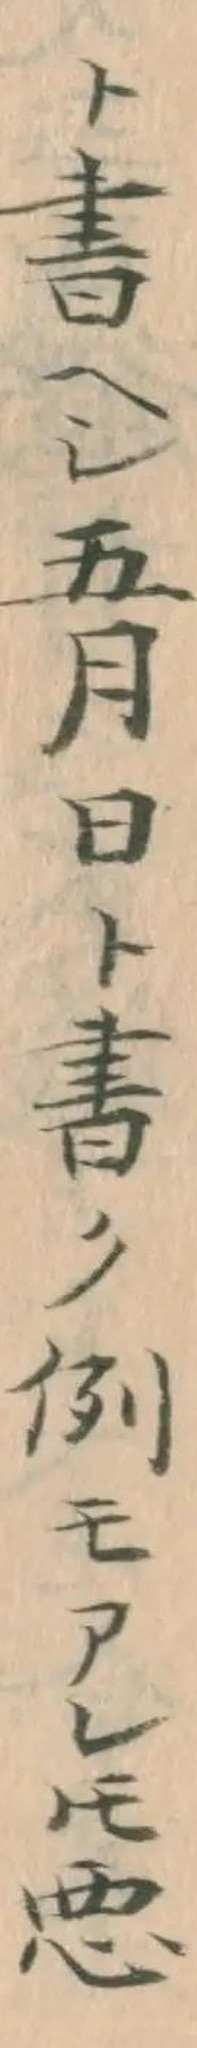ト書ヘシ五月日ト書ク例モアレトモ悪
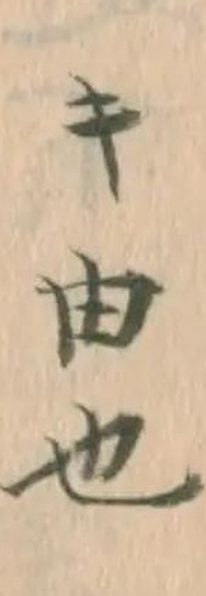キ由也
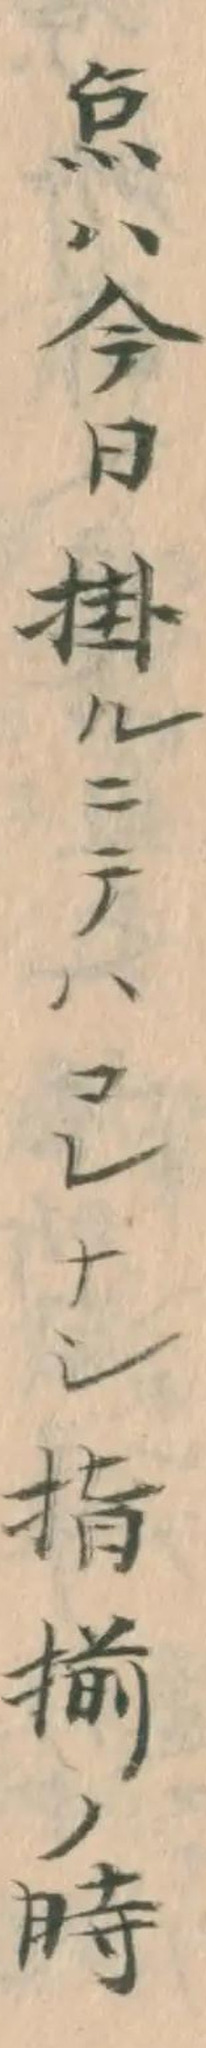点ハ今日掛ルニテハコレナシ指揃ノ時
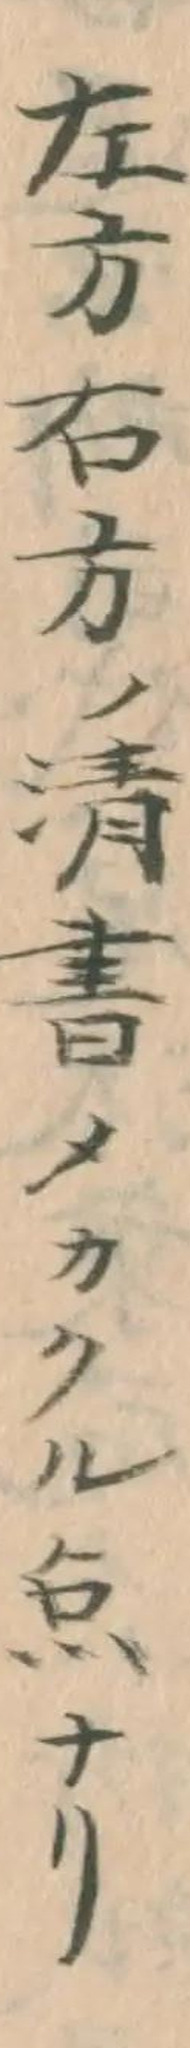左方右方ノ清書メカクル点ナリ
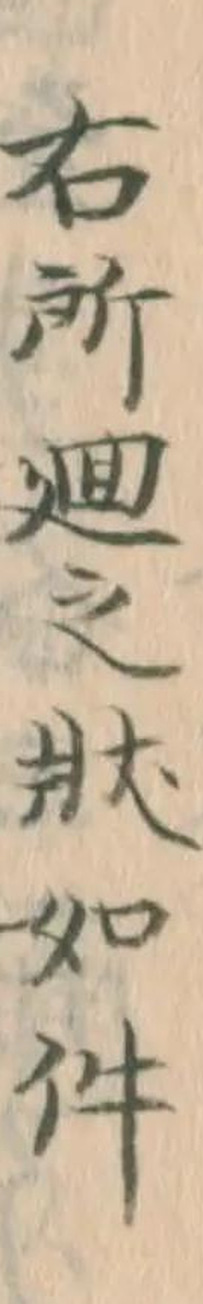右所廻之状如件
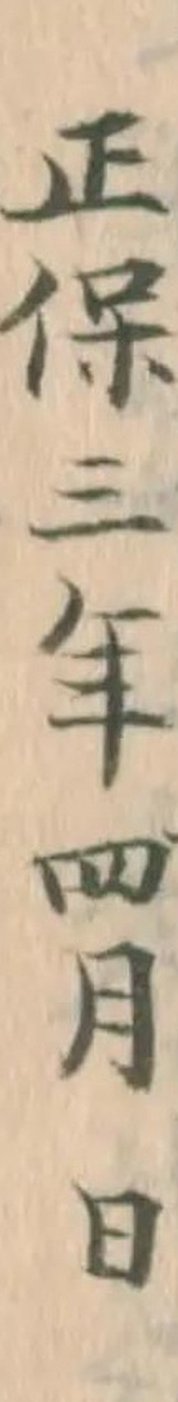正保三年四月日
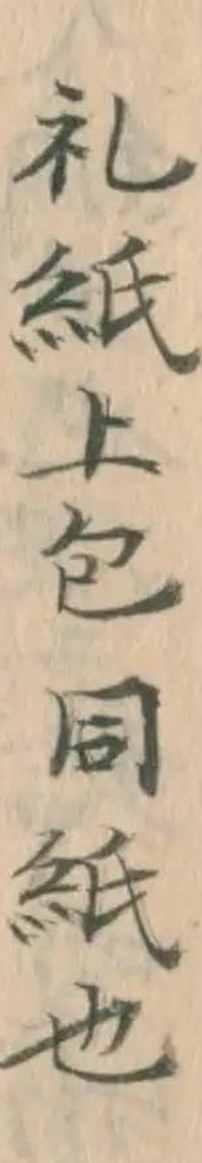礼紙上包同紙也
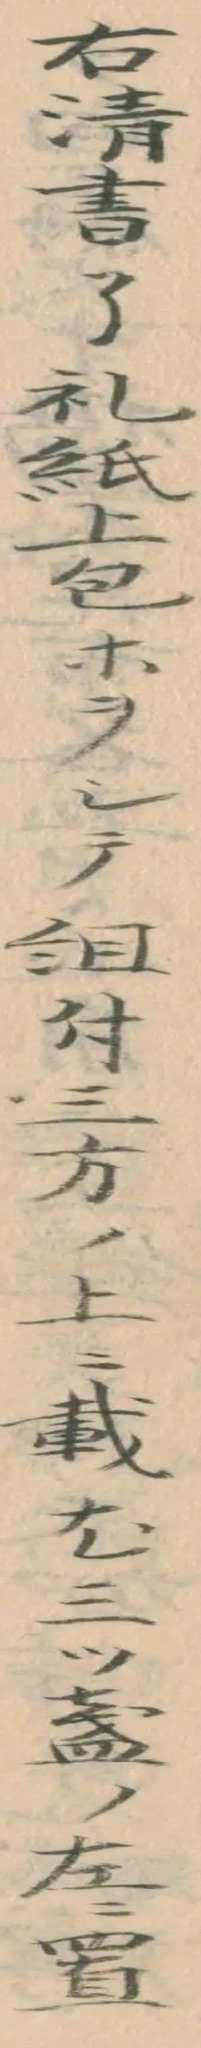右清書了礼紙上包等ヲシテ組付三方ノ上ニ載尤三ツ盞ノ左ニ置
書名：賀茂社記録. 第40冊
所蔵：国立国会図書館 National Diet Library, JAPAN
